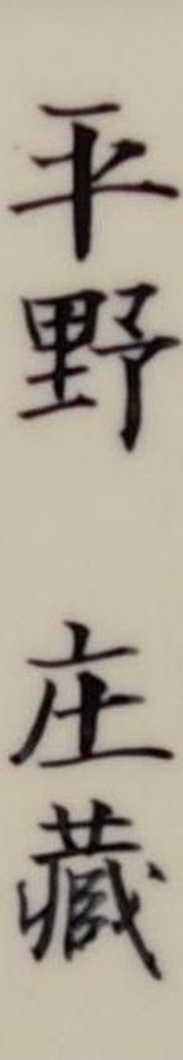平野庄蔵
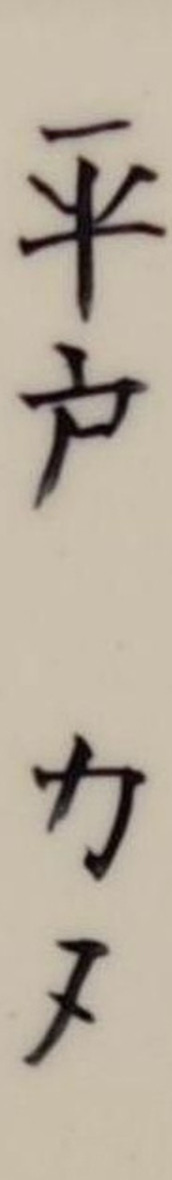平戸カメ
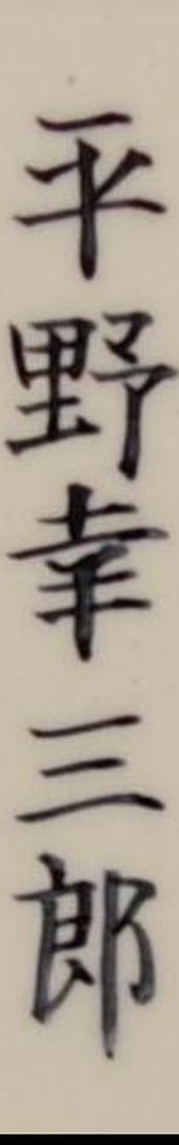平野幸三郎
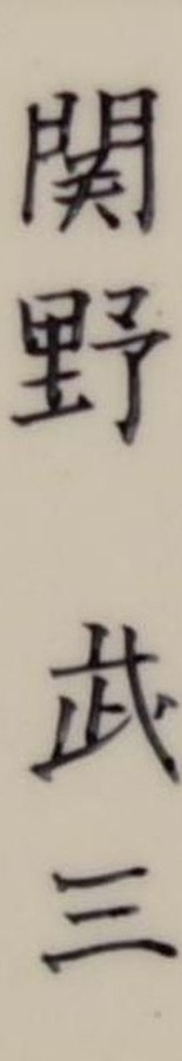関野武三
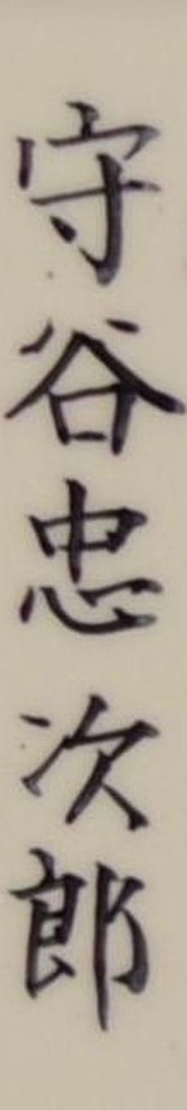守谷忠次郎
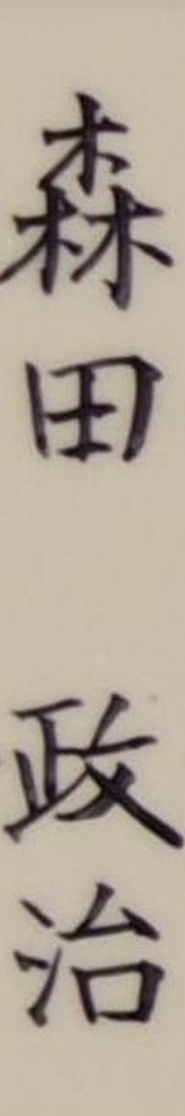森田政治
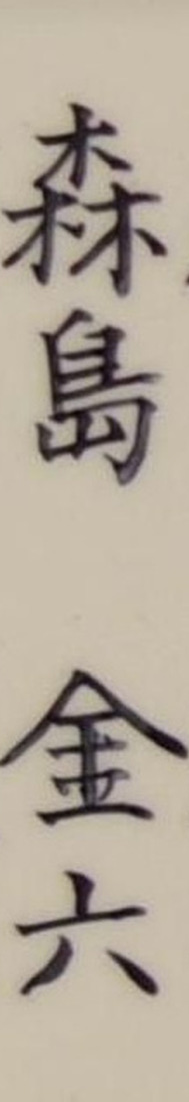森島金六
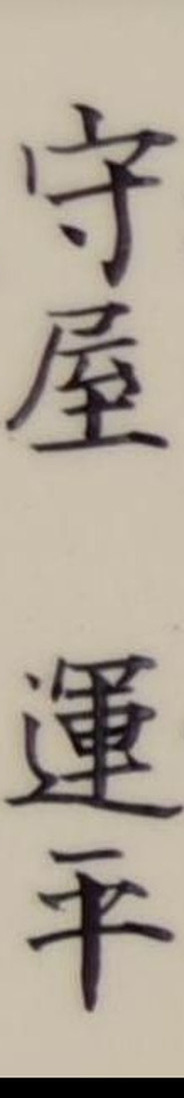守屋運平
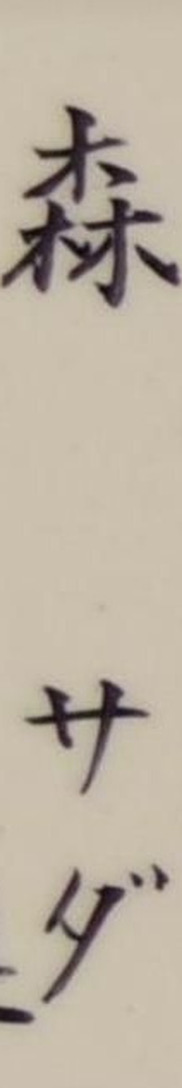森サダ

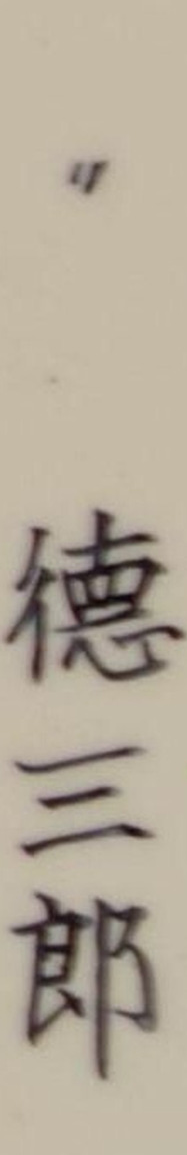徳三郎
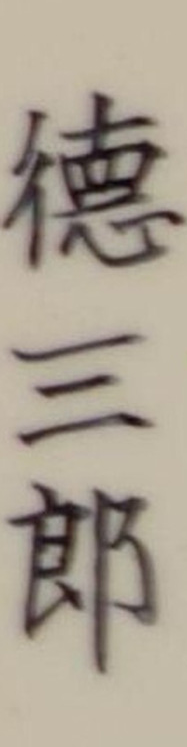徳三郎
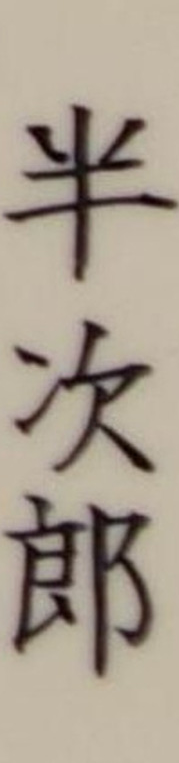半次郎
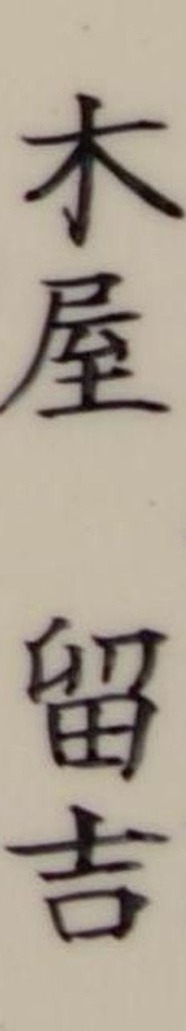木屋留吉
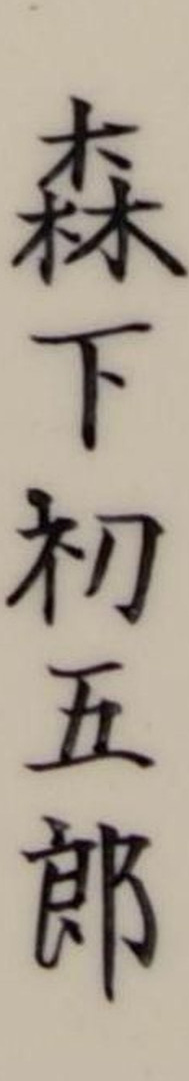森下初五郎
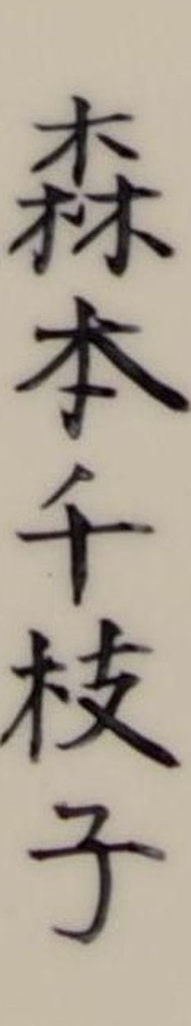森本千枝子
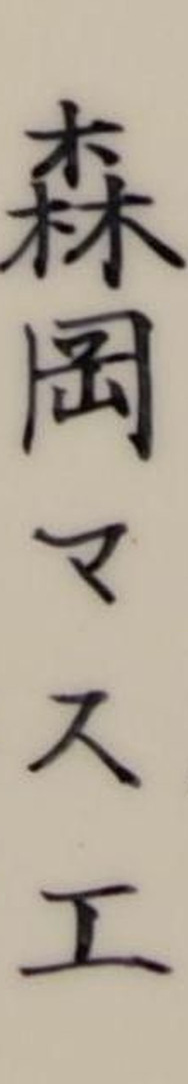森岡マスエ
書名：M~S
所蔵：高野山金剛峯寺
